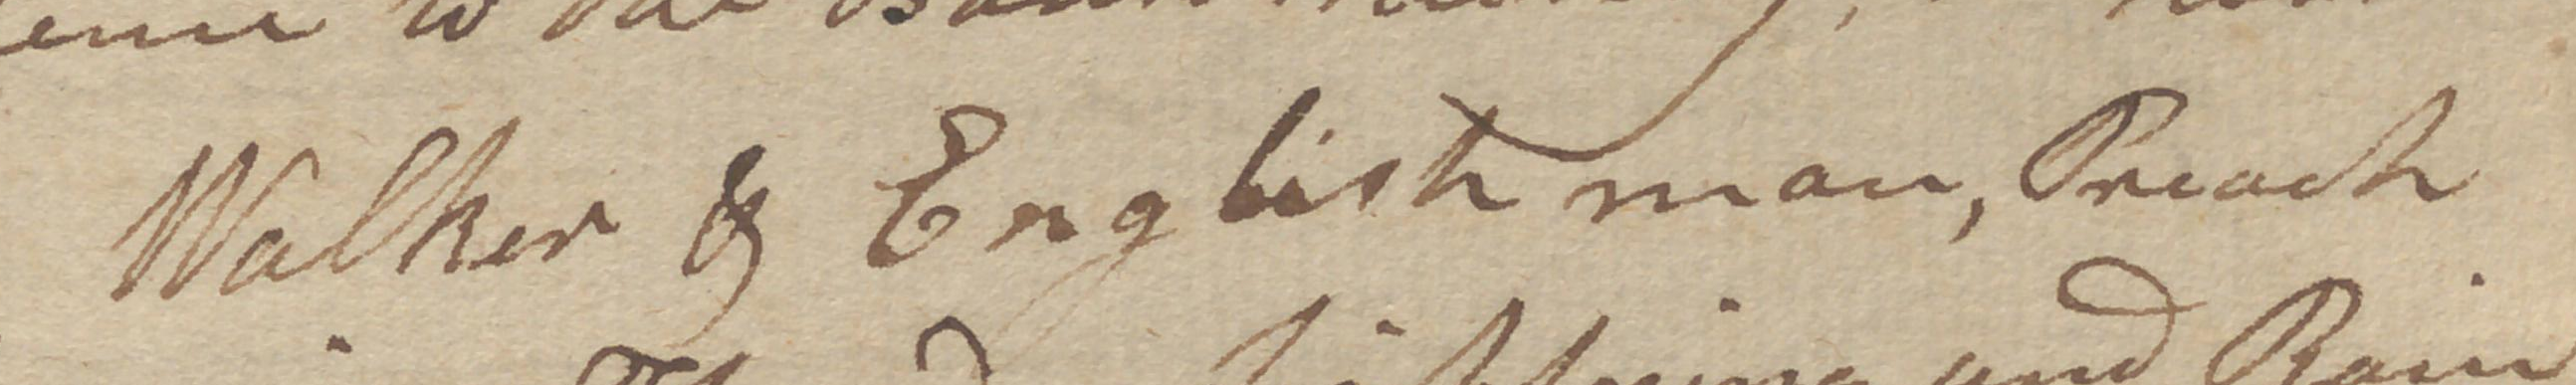Walker & English man, Preach
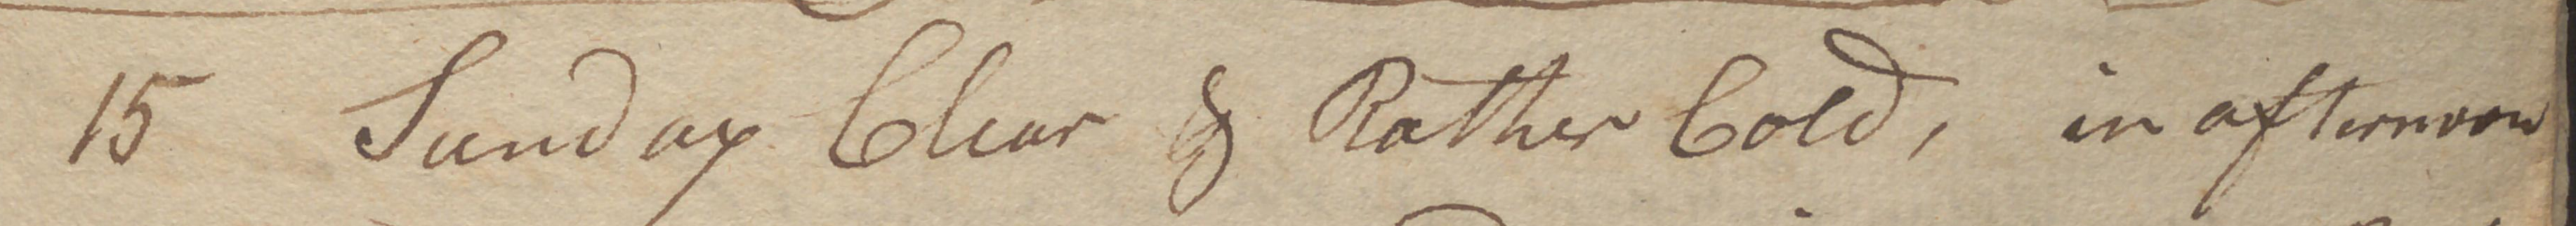15 Sunday Clear & Rather Cold, in afternoon
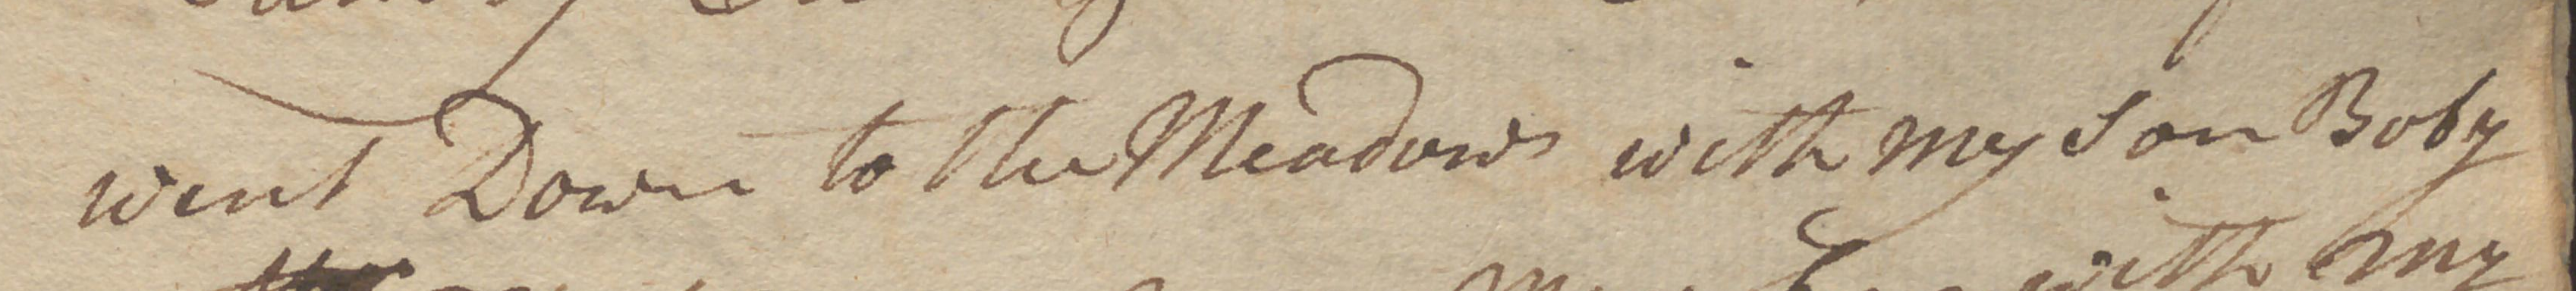went Down to the Meadows with my son Boby
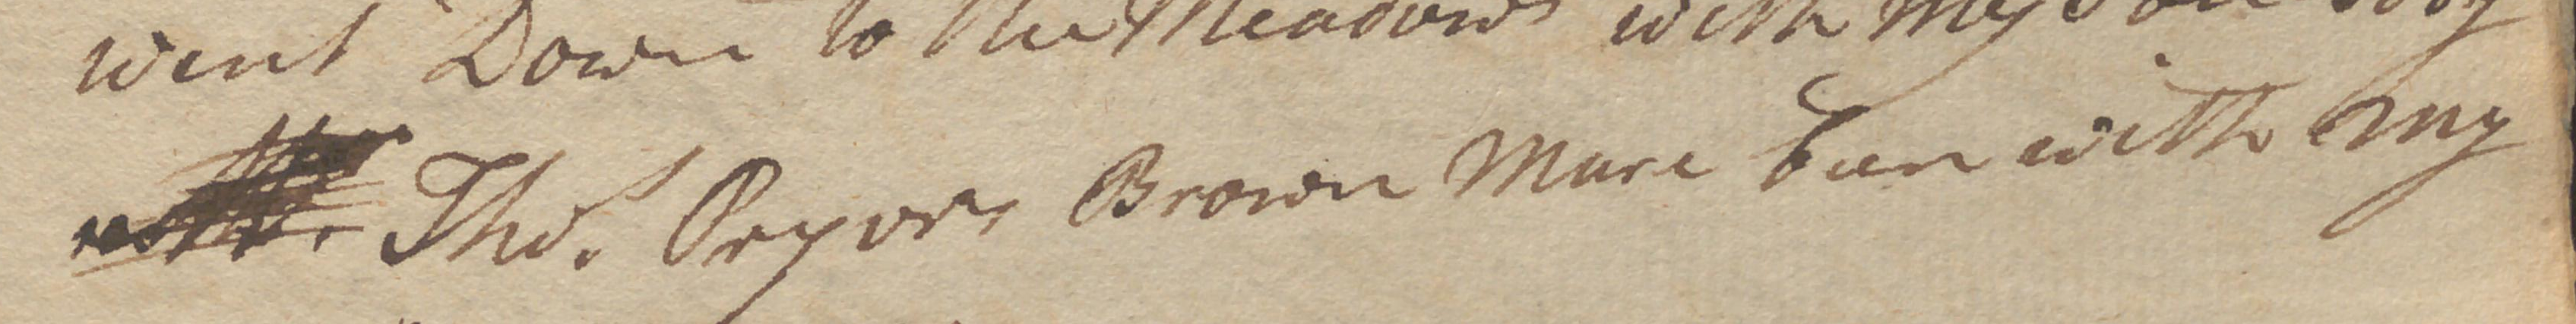[___] Tho^s. Pryors Brown Mare been with any
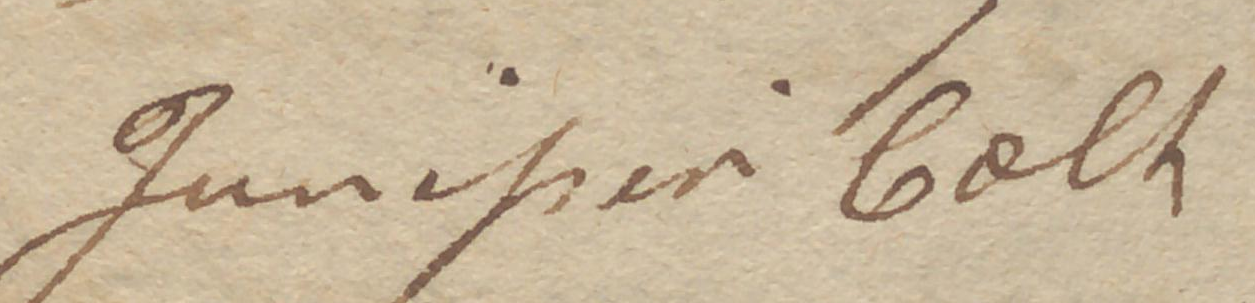Juneper Colt
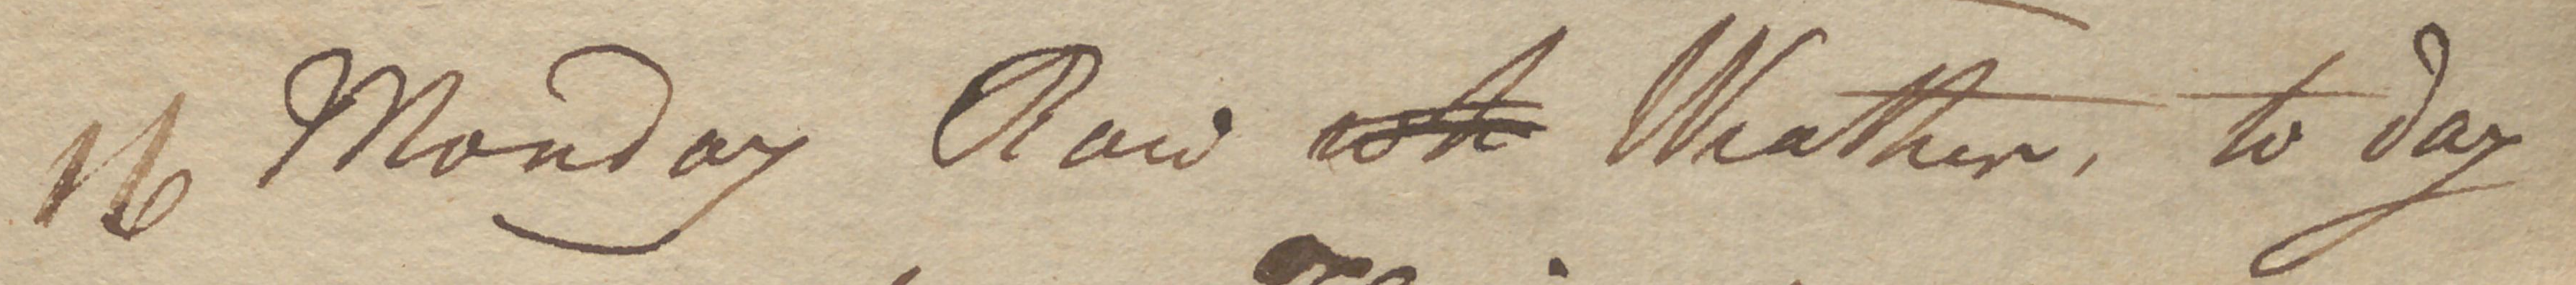16 Monday Raw [wh] Wathen, to day
